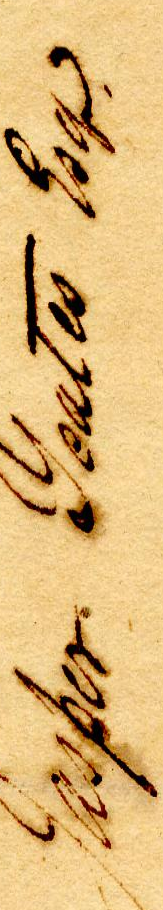Jasper Yeates Esq
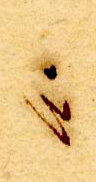at
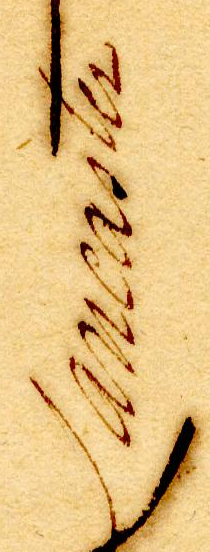Lancaster
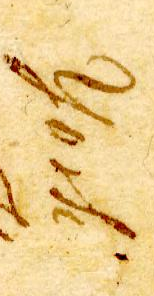York
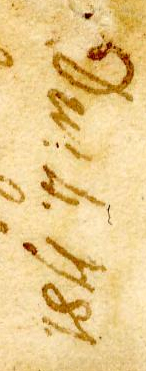Dec^r. 4. 1781.
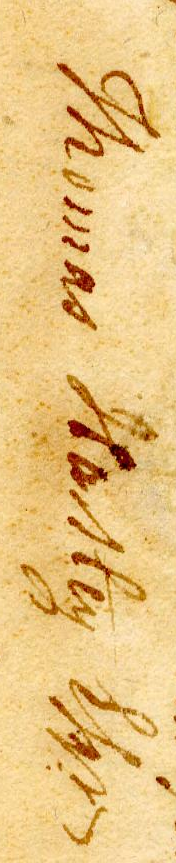Thomas Hartley Esq^r.
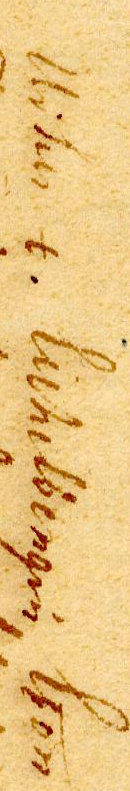When t. Eichelbenger from
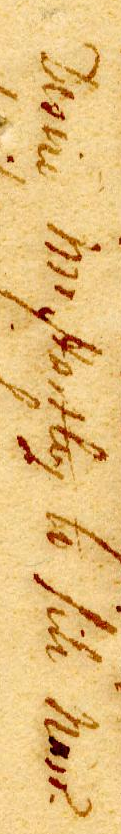Desire M^r Hartley to file Nan.
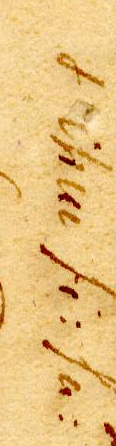& chue fo: fa:
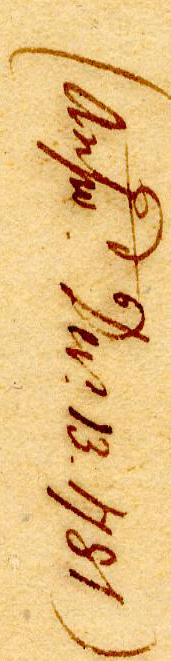(Answ^d Dec^r 13. 1781)
